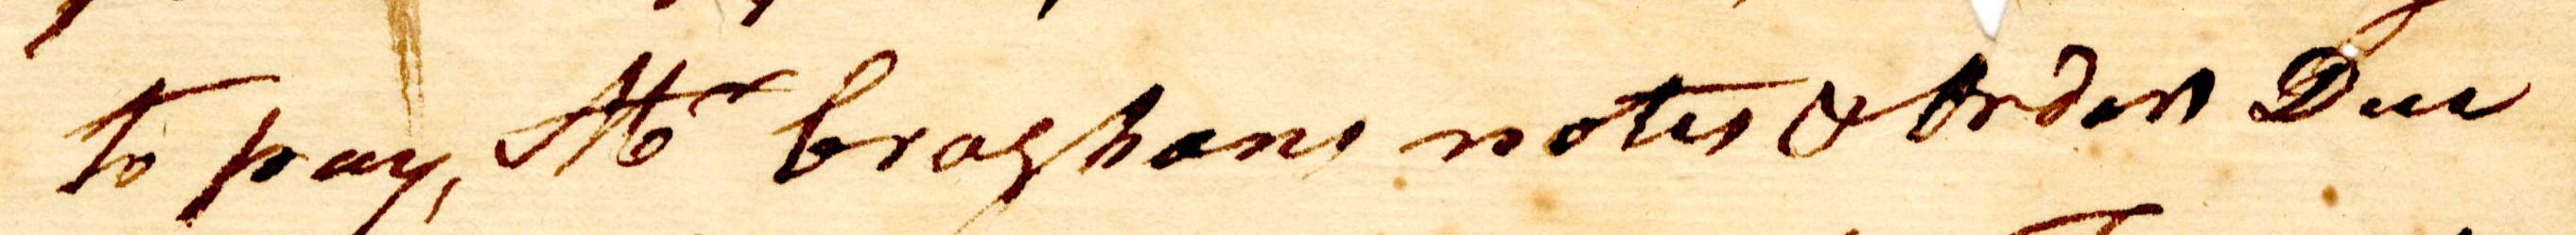to pay, M^r Craghans notes & Order Due
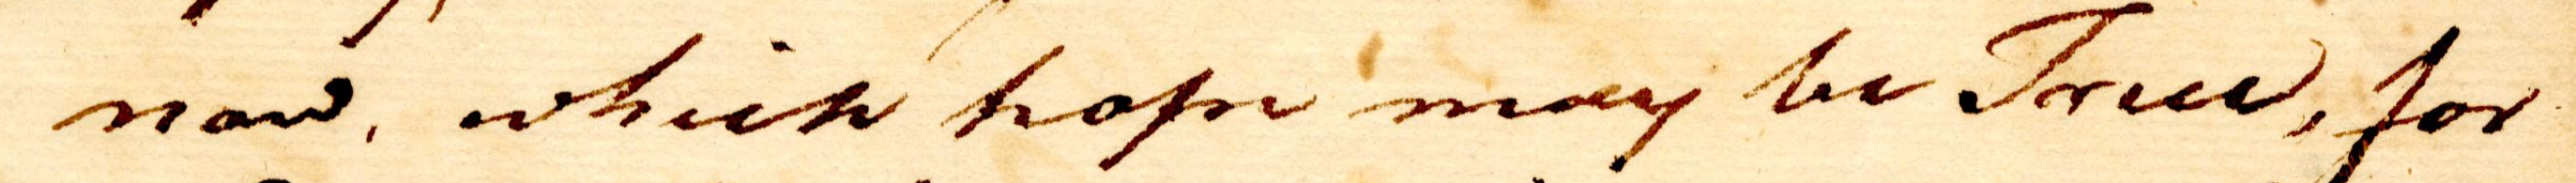now, which hope may be true, for
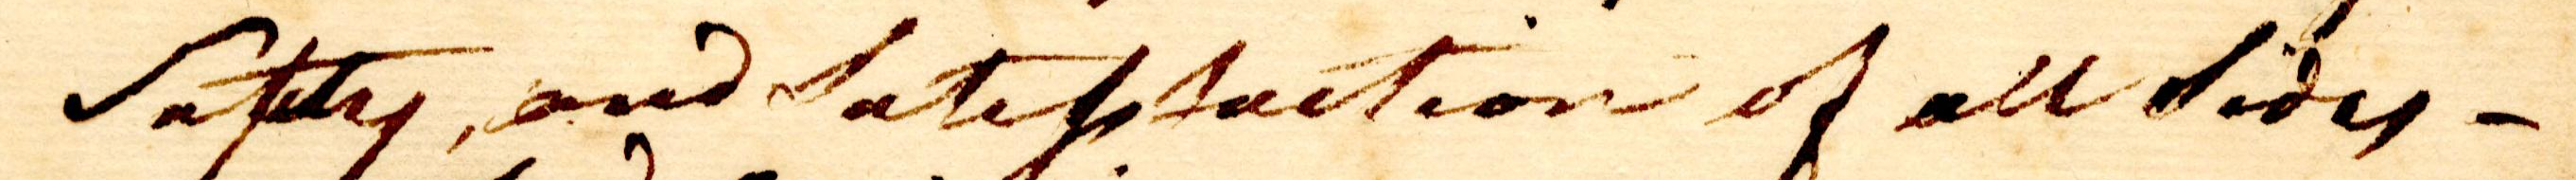Safety, and satisfaction of all sides-
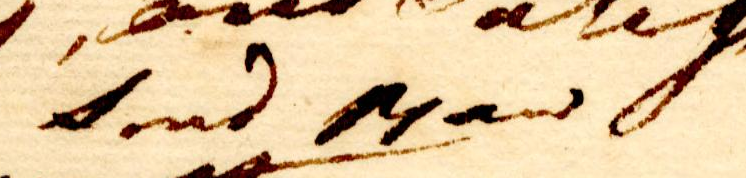send you
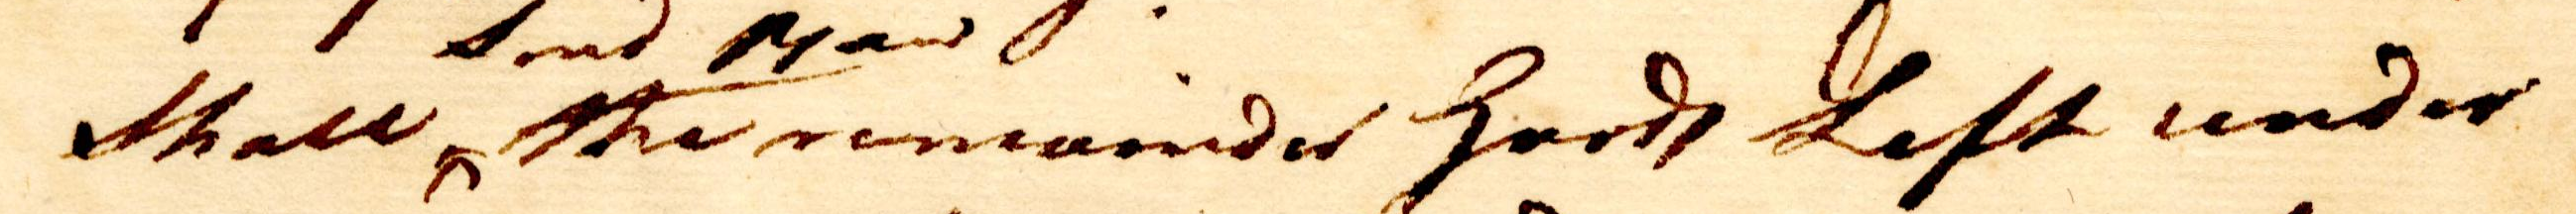Shall ^ the remainder goods Left under
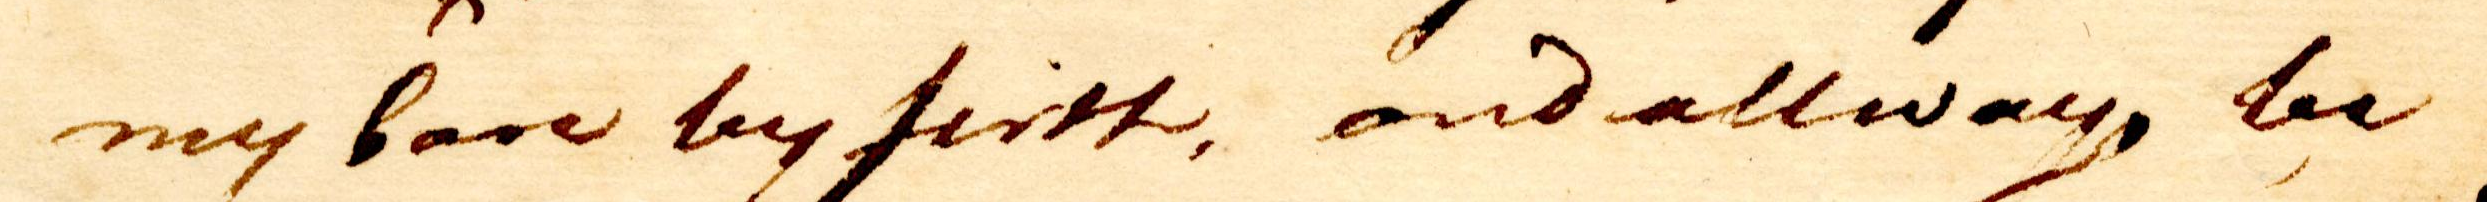my Care by first, and allways be
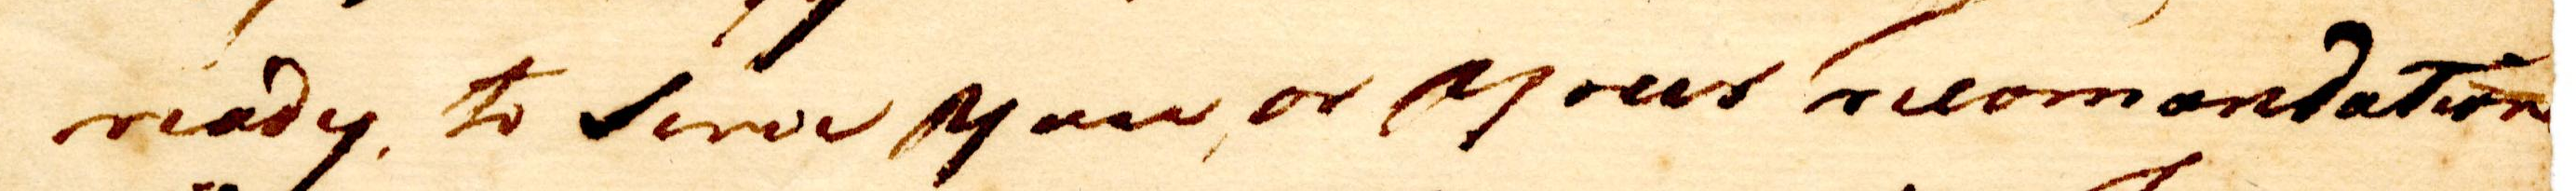ready to serve you or your recommendation
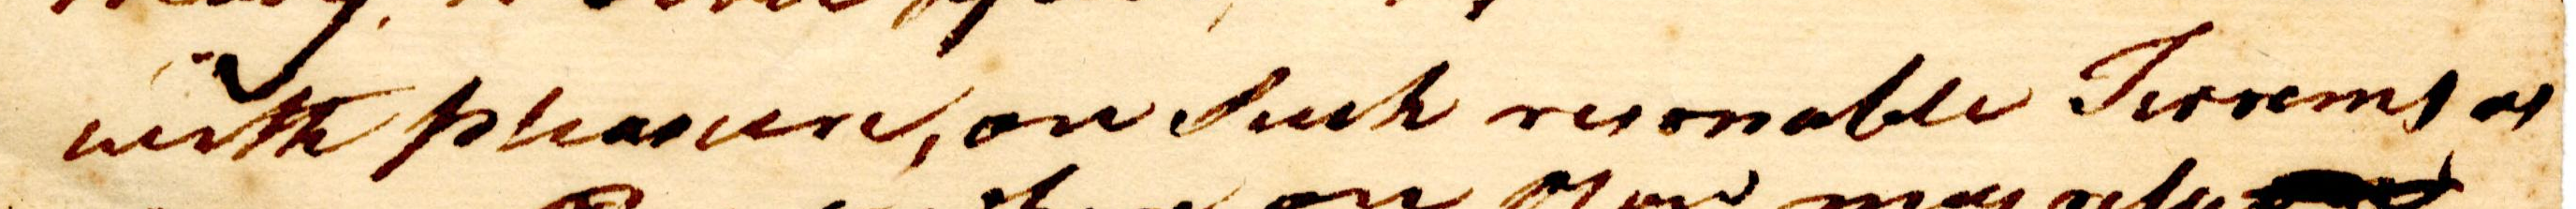with pleasure, on Such reasonable terms as
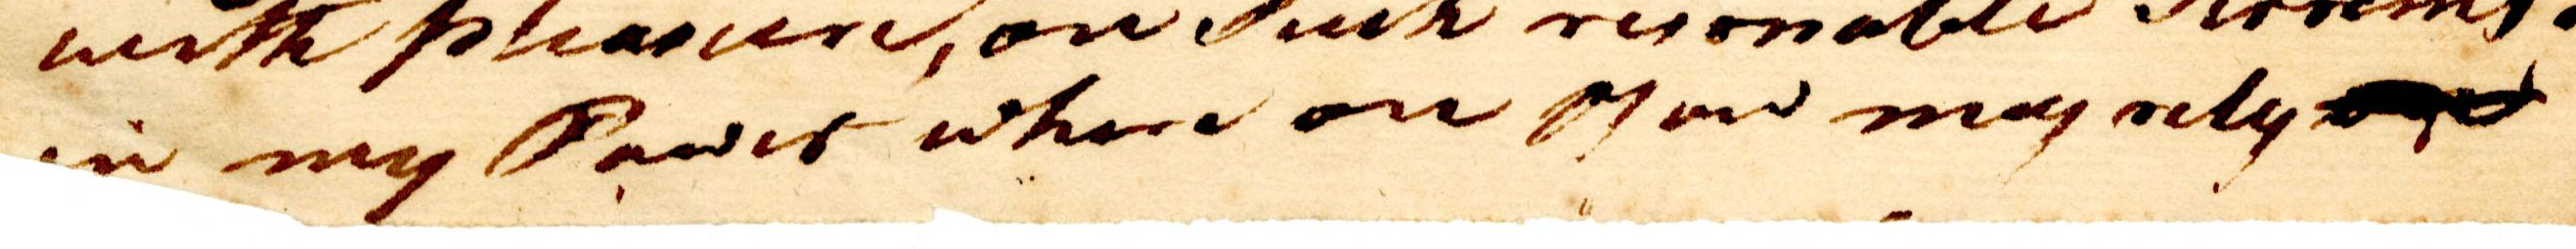in my power where as you may rely [___]
